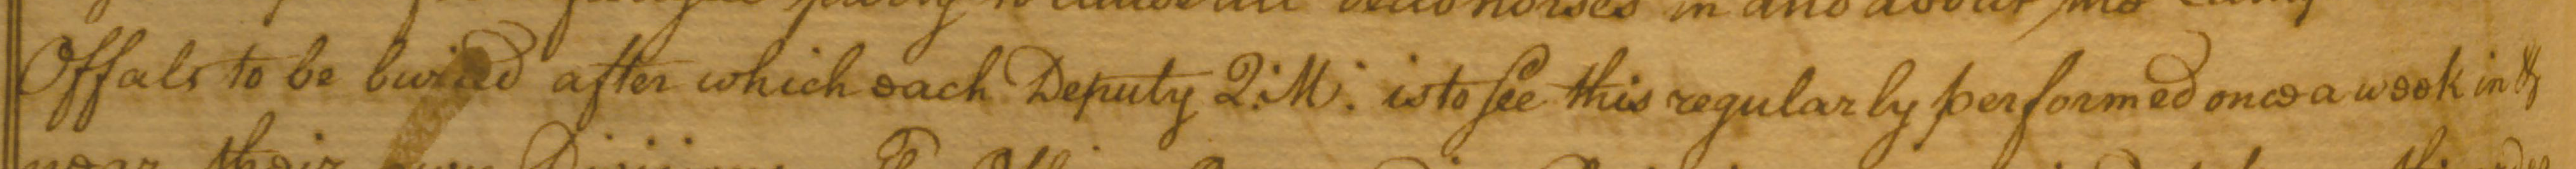Offals to be buried after which each Deputy Q: M: is to see this regularly performed once a week in &
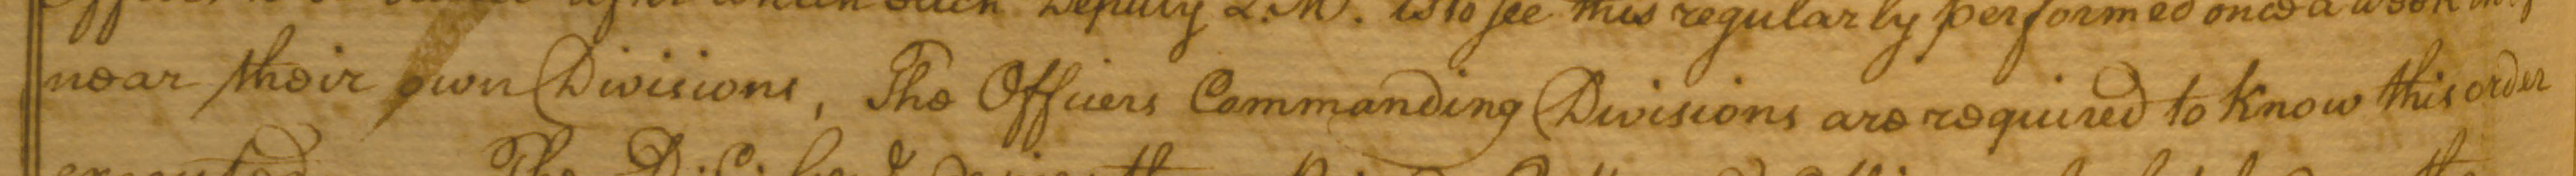near their own Divisions, The Officers Commanding Divisions are required to know this order
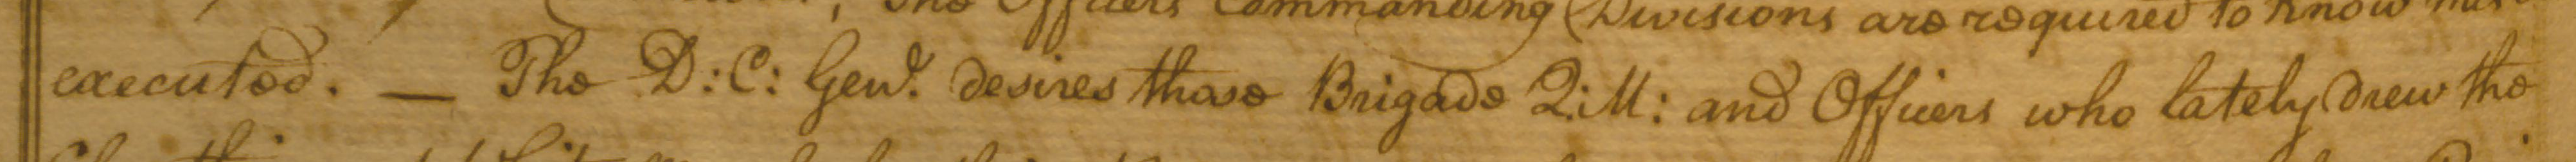executed.- The D: C: Gen^l. desires those Brigade Q: M: and Officers who lately drew the
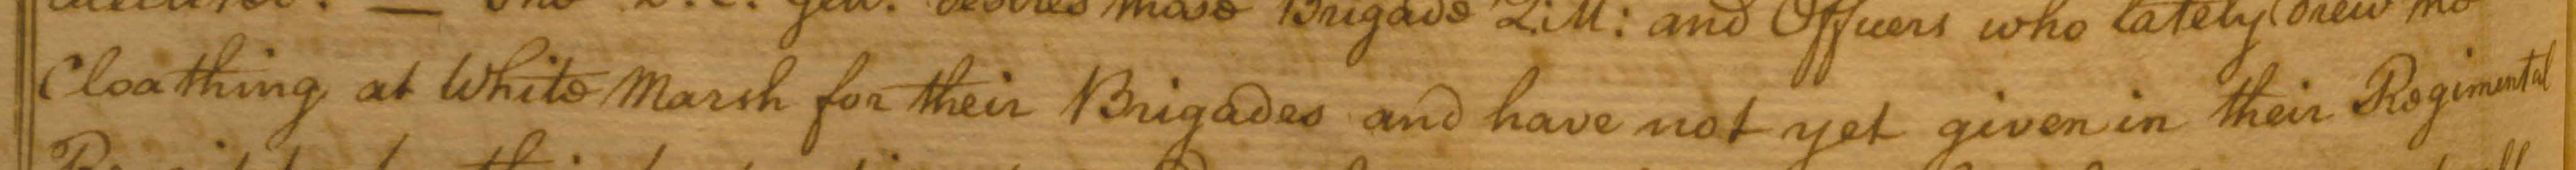Cloathing at White March for their Brigades and have not yet given in their Regimental
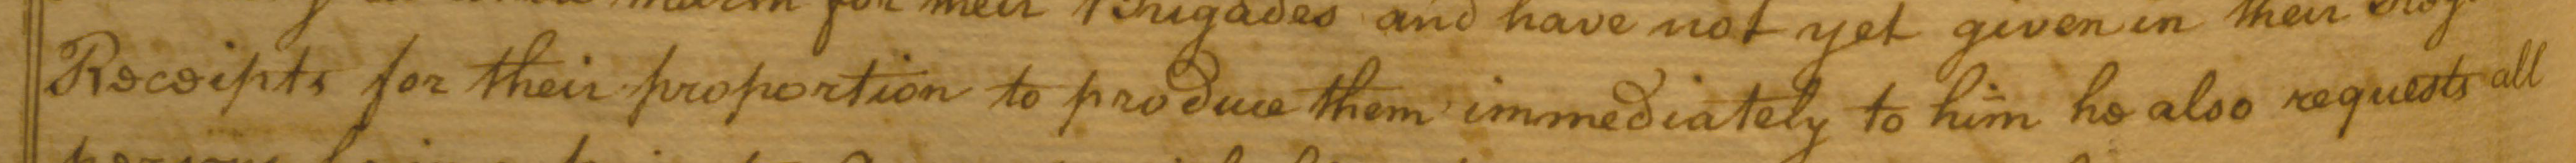Receipts for their proportion to produce them immediately to him he also requests all
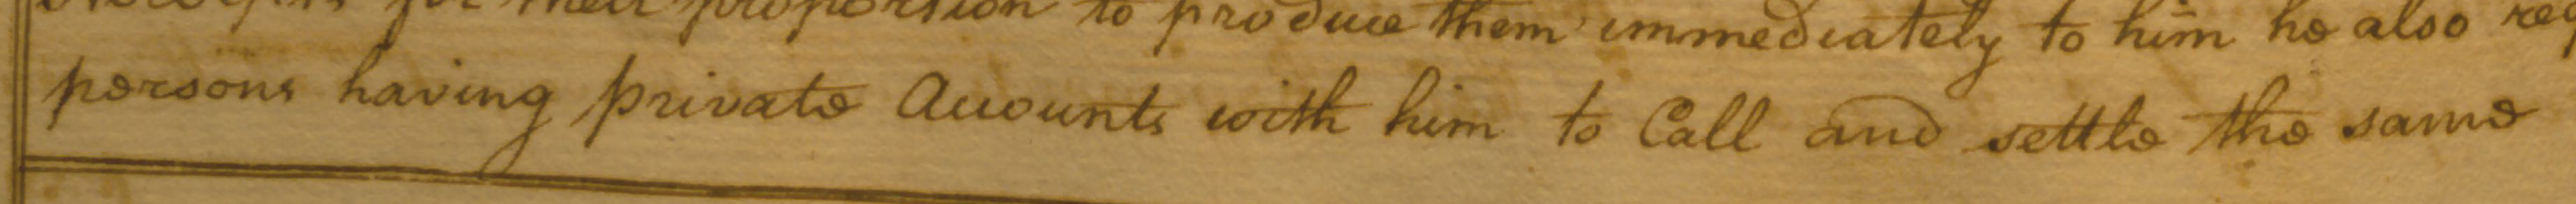persons having private Accounts with him to Call and settle the same
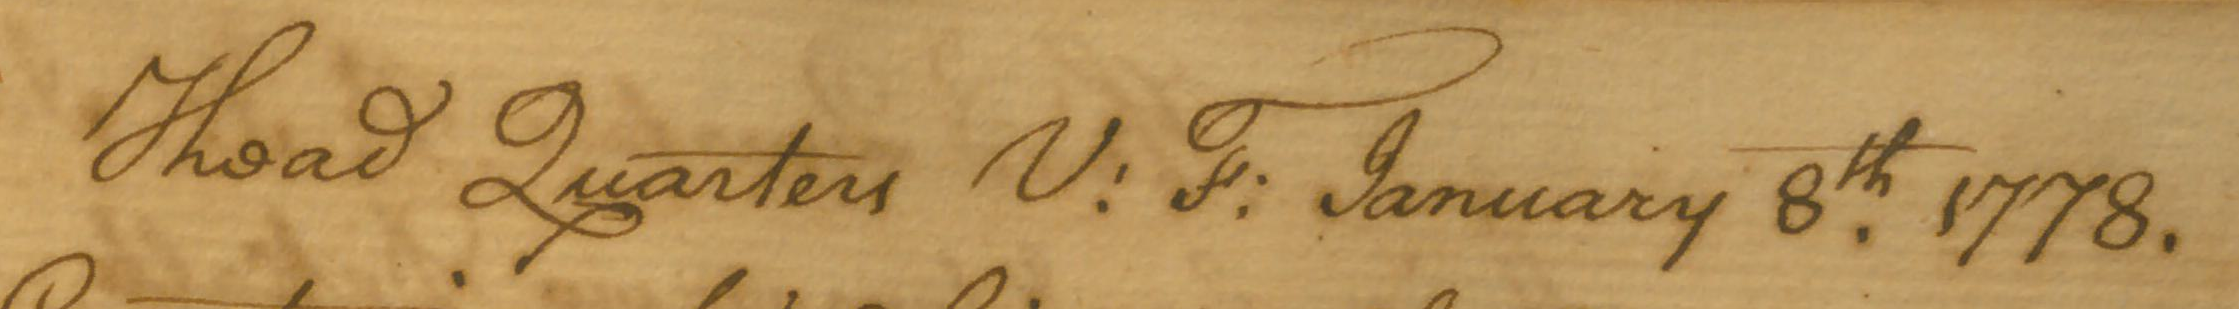Head Quarters V: F: January 8^th. 1778.
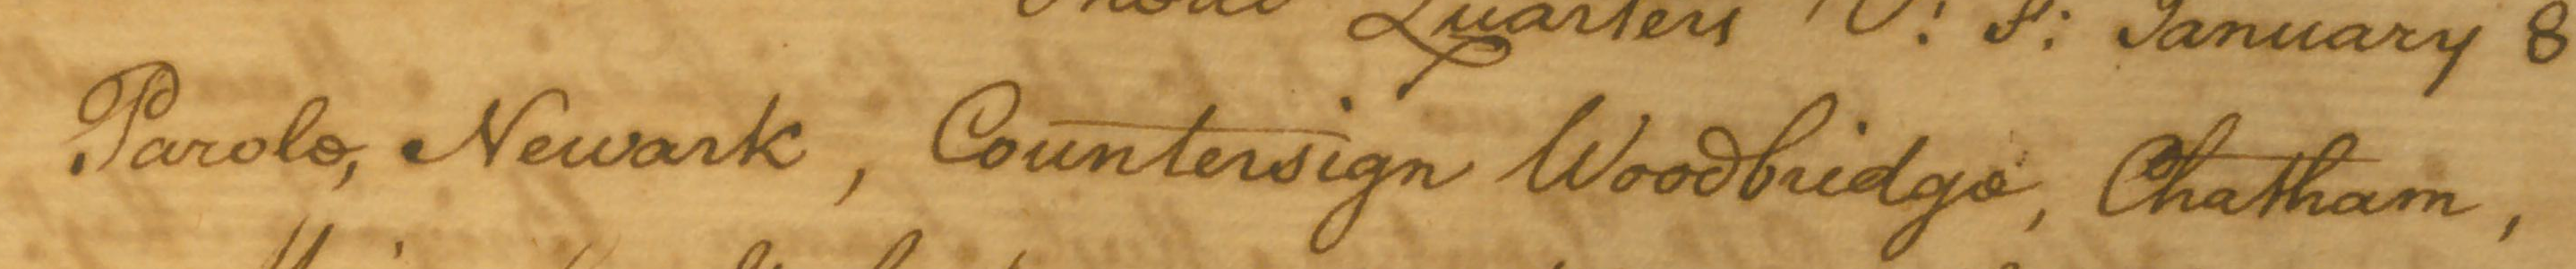Parole Newark, Countersign Woodbridge, Chatham,
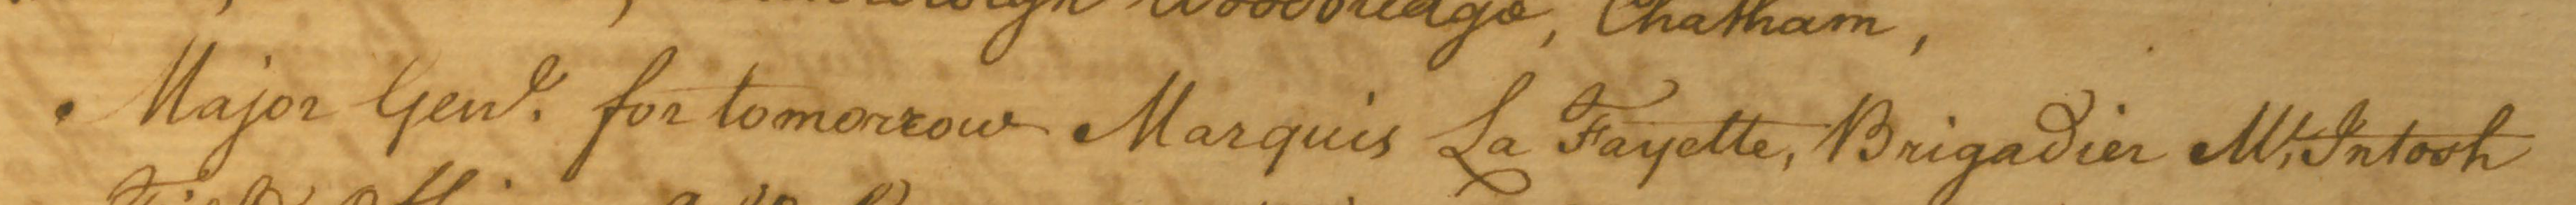Major Gen^l. for tomorrow Marquis La Fayette, Brigadier M^c.Intosh
